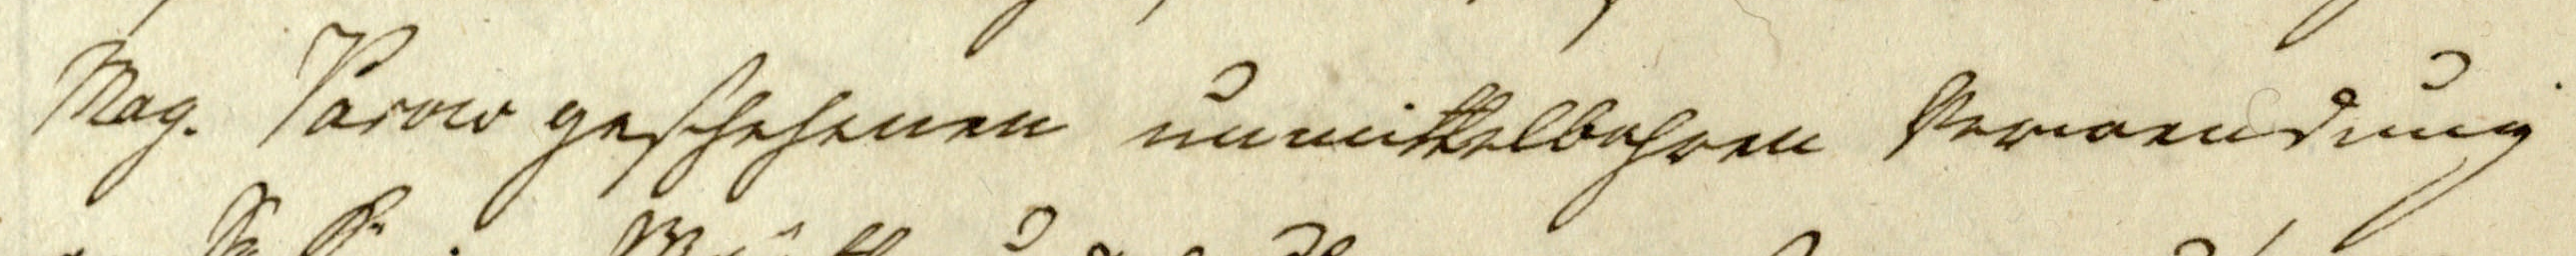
Mag. Parow geschehenen unmittelbahren Verwendung
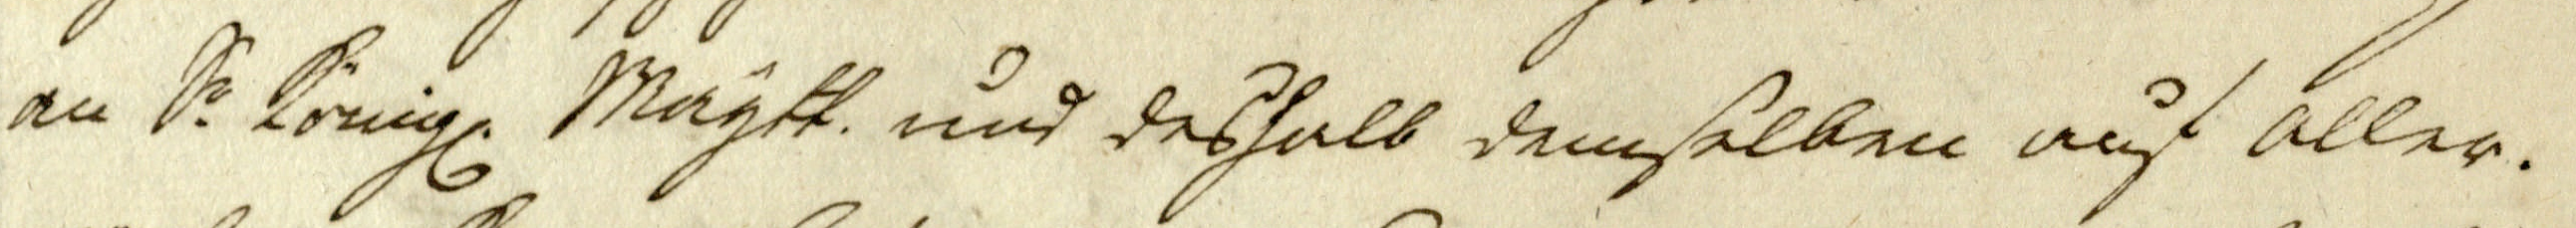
an Sr. Königl. Maÿtt. und deshalb demselben auf aller¬
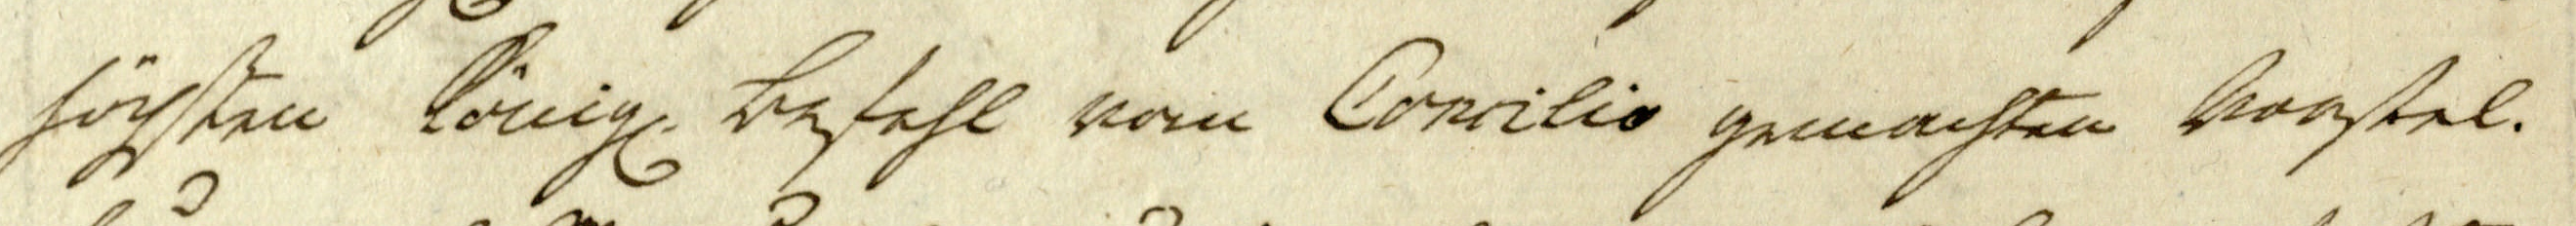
höchsten Königl. Befehl vom Concilio gemachten Vorstel¬
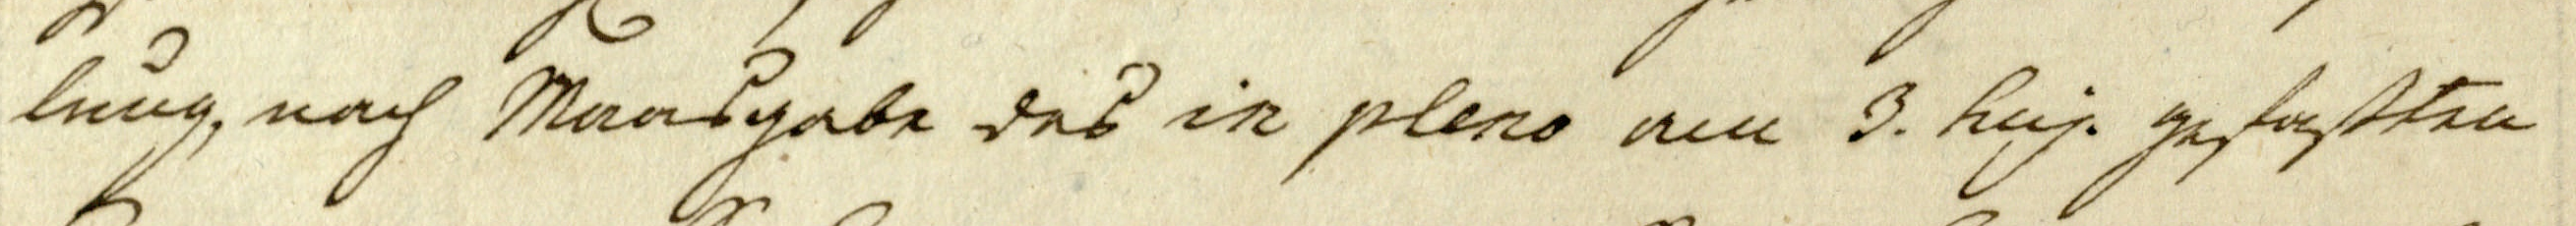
lung, nach Maasgabe des in pleno am 3. huj. gefaßten
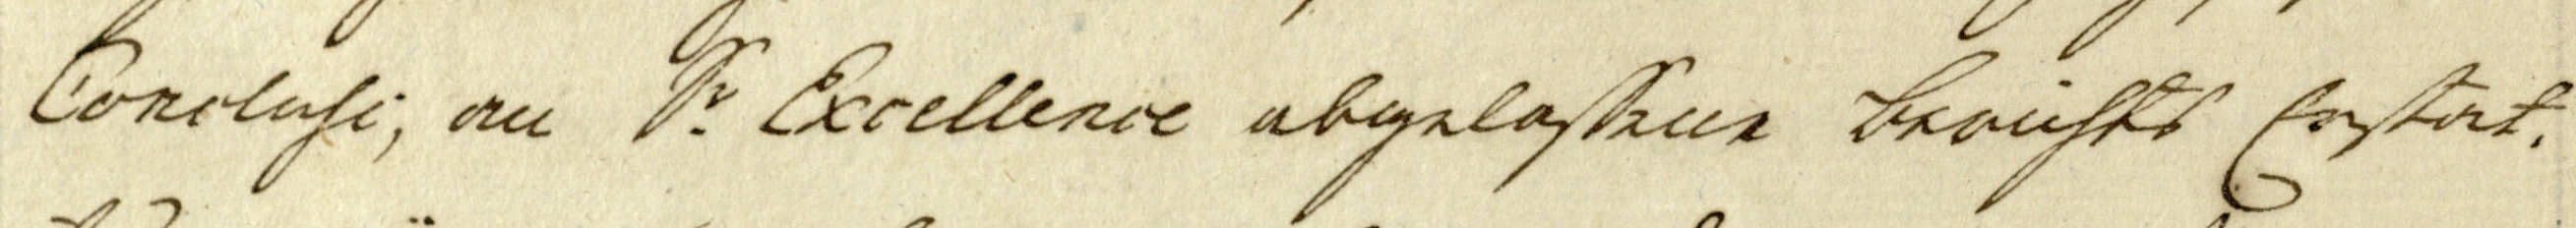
Conclusi, an Sr. Excellence abgelassene Berichts Erstat¬
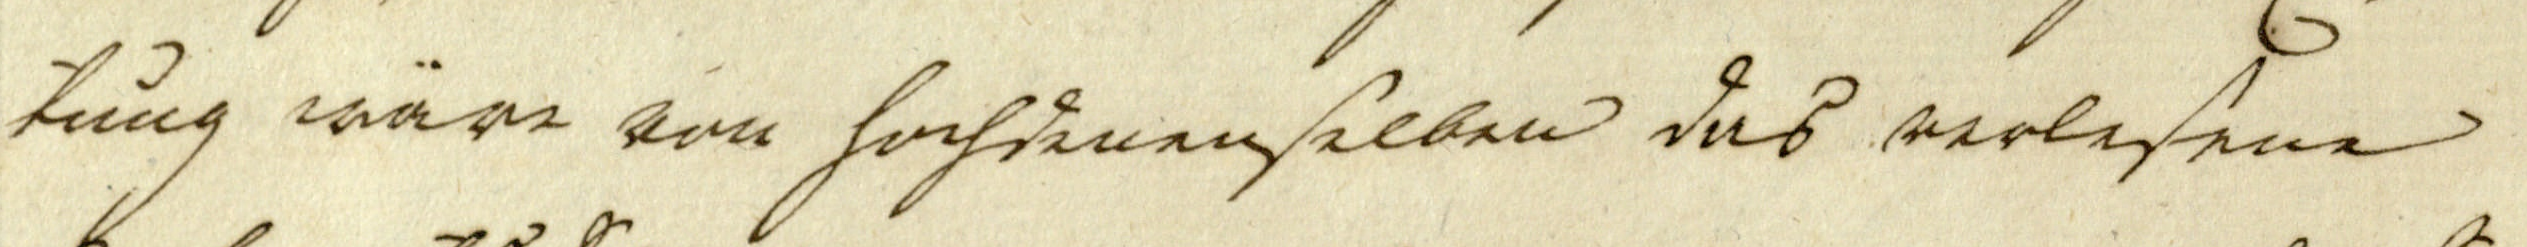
tung wäre von hochdenenselben das verlesene
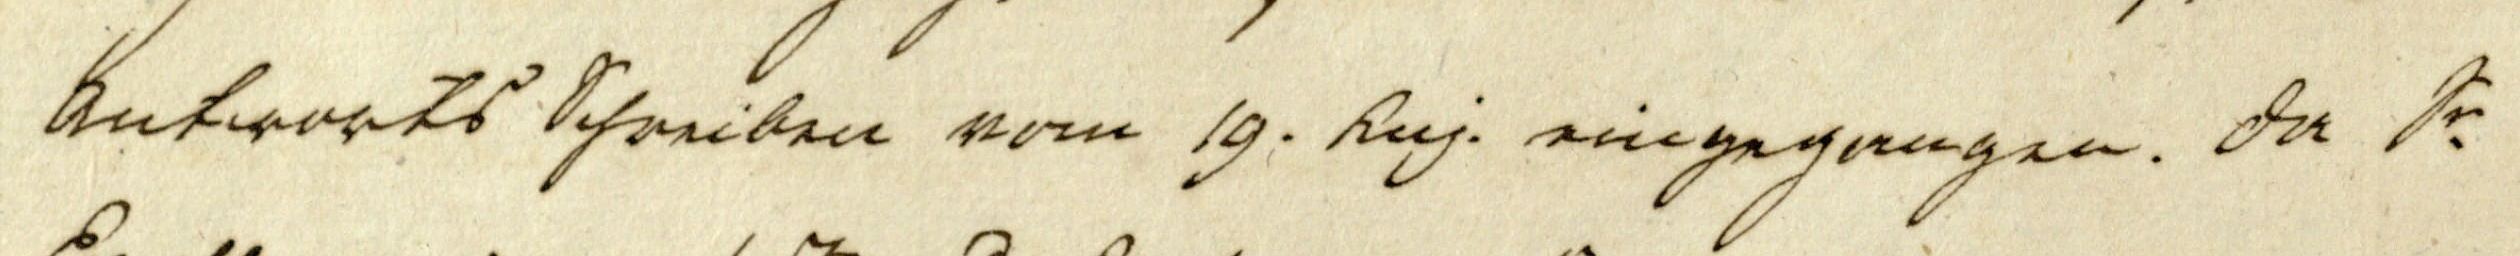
Antworts Schreiben vom 19. huj. eingegangen. Da Sr.
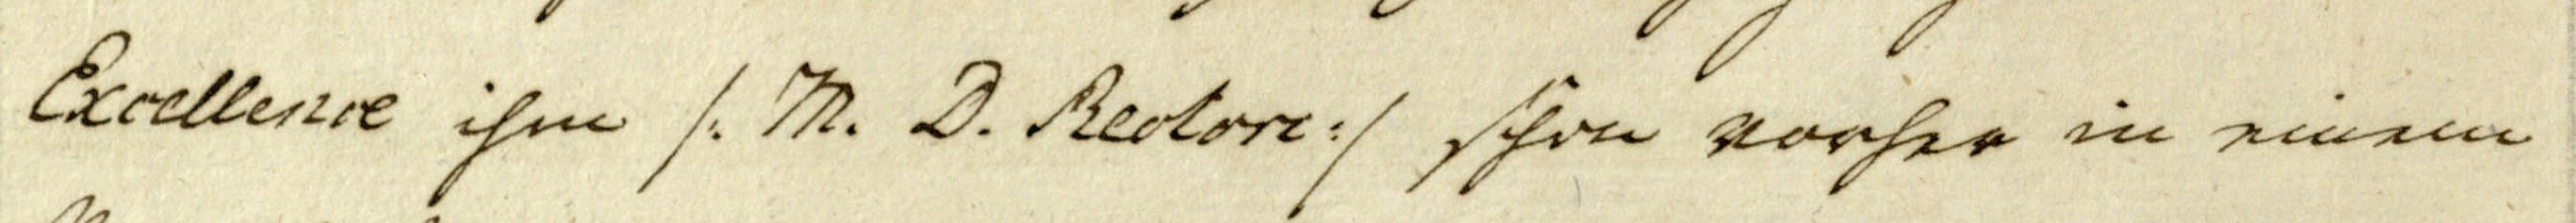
Excellence ihm / M. D. Rectore / schon vorher in einem
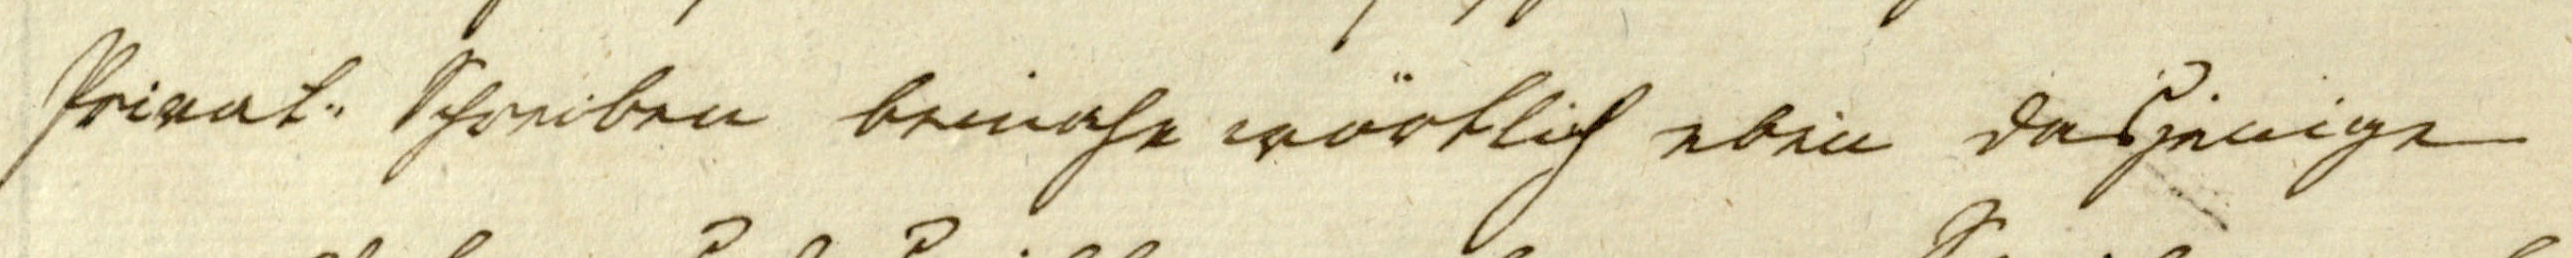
Privat-Schreiben beinahe wörtlich eben dasjenige
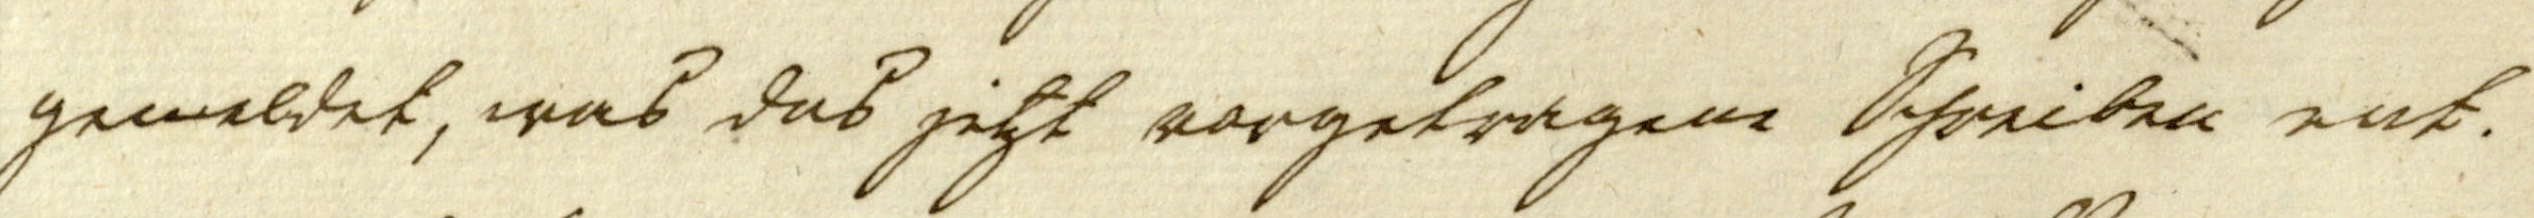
gemeldet, was das jetzt vorgetragene Schreiben ent¬
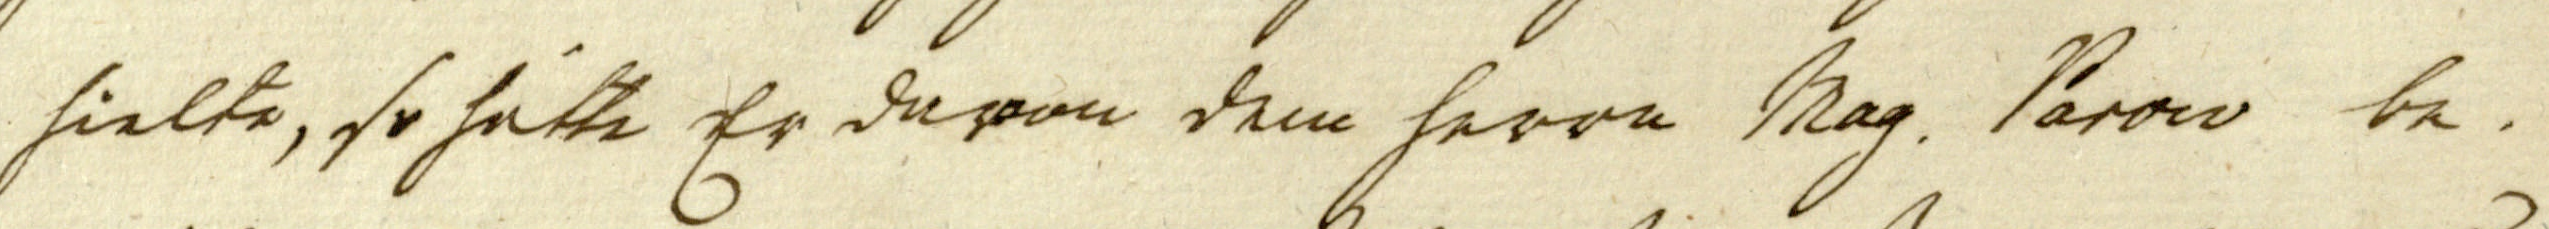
hielte, so hätte Er davon dem herrn Mag. Parow be¬
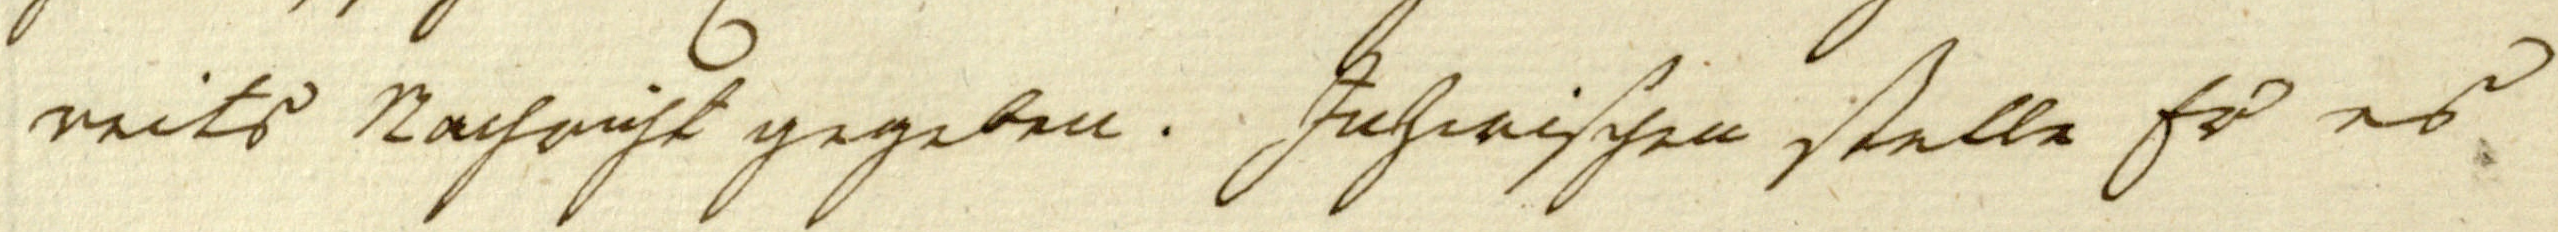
reits Nachricht gegeben. Inzwischen stelle Er es
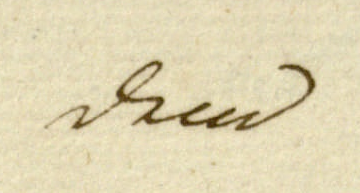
dem
